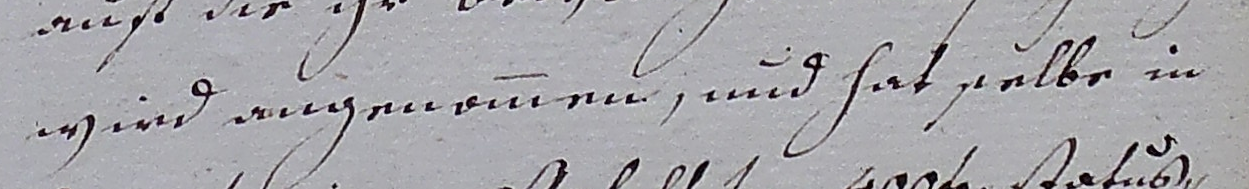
wird angenom̅en, und hat selbe in
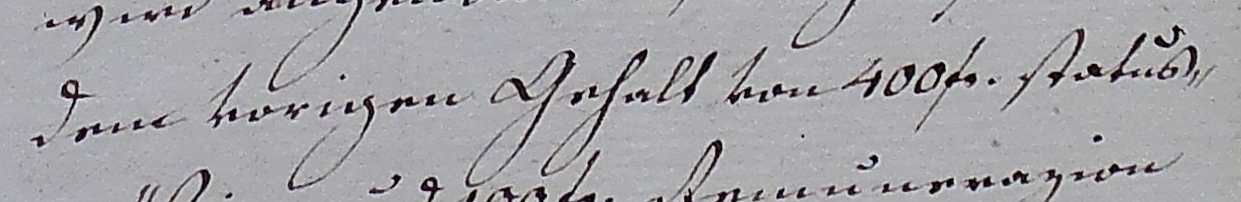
dem vorigen Gehalt von 400fr. status¬
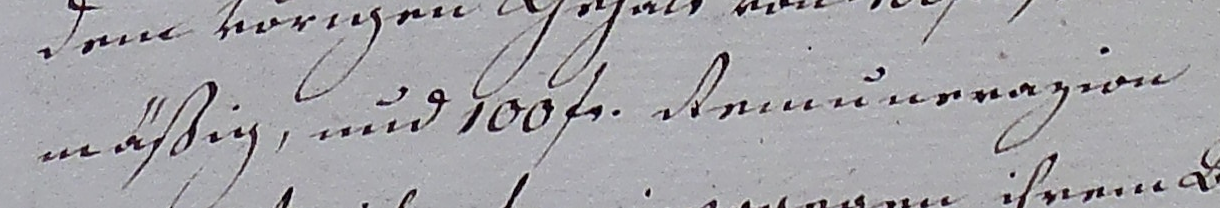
mäßig, und 100fr. Remunerazion
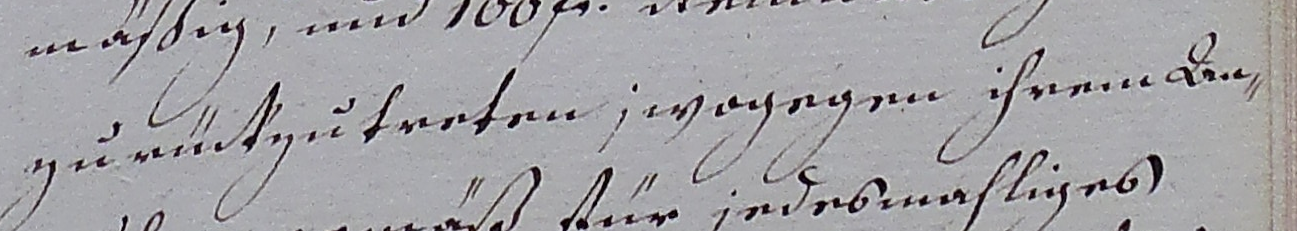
zurükzutreten; wogegen ihrem An¬
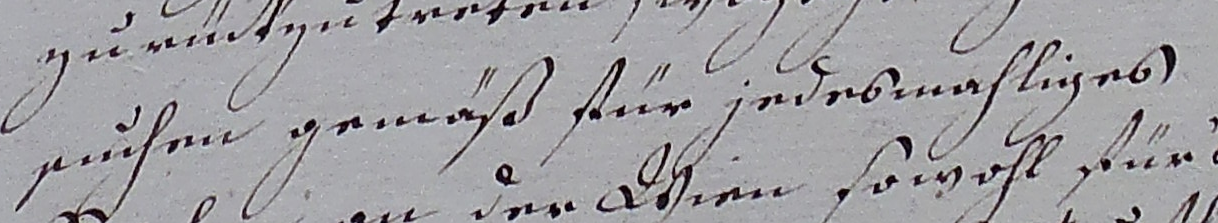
suchen gemäß für jedesmahliges
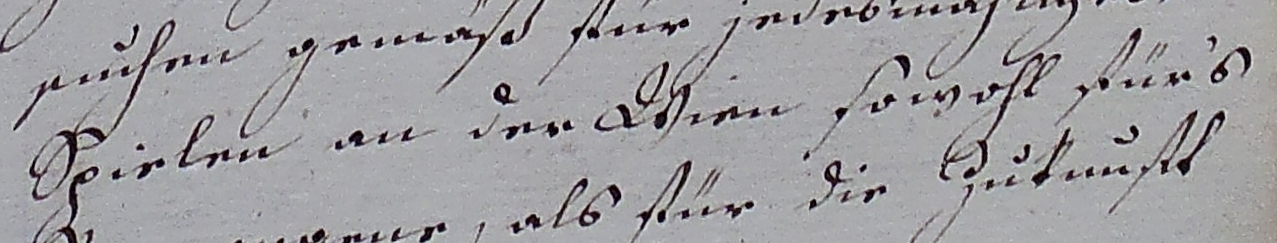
Spielen an der Wien sowohl für's
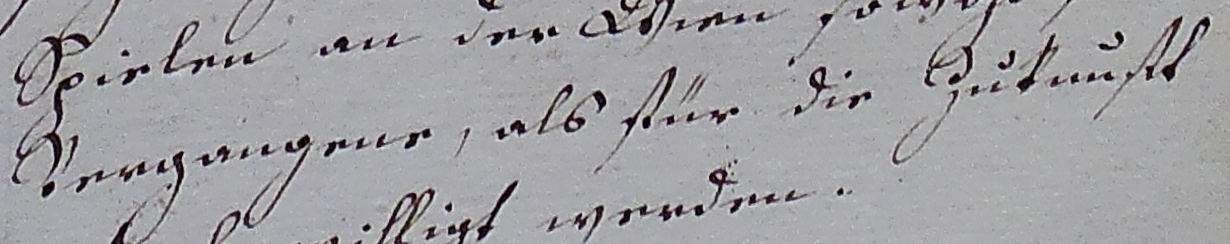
Vergangene, als für die Zukunft
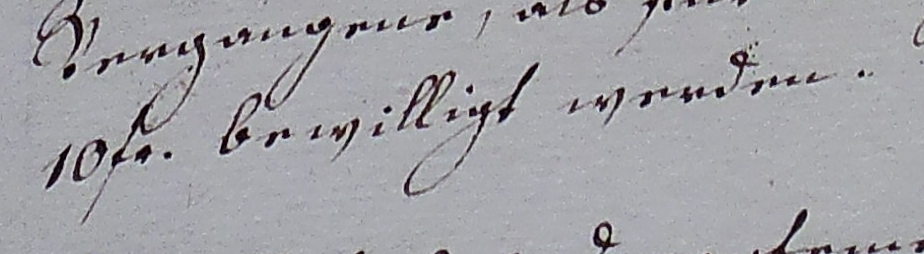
10fr. bewilligt werden.
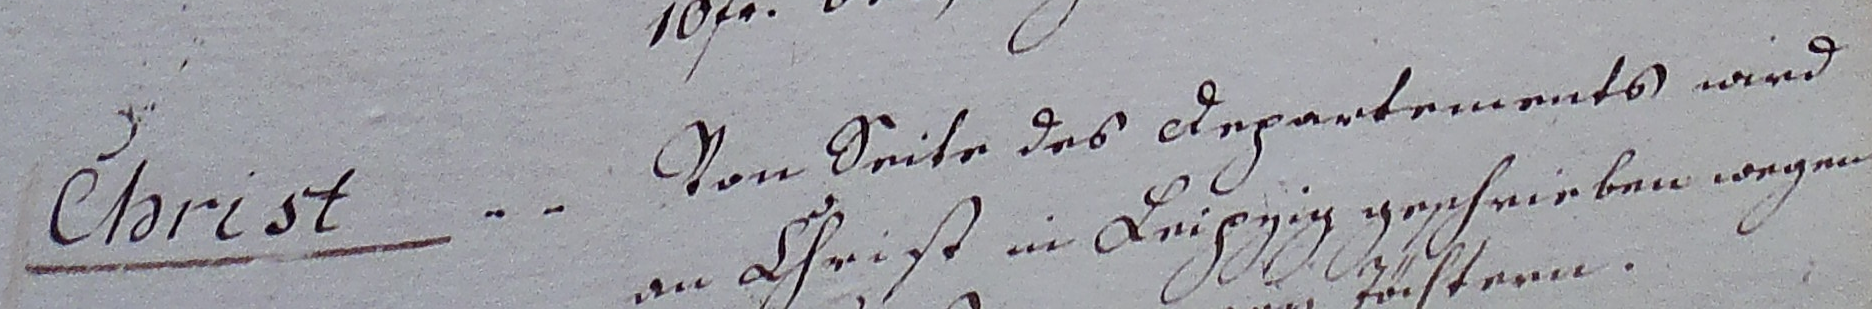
Christ .. .. Von Seite des Departements wird
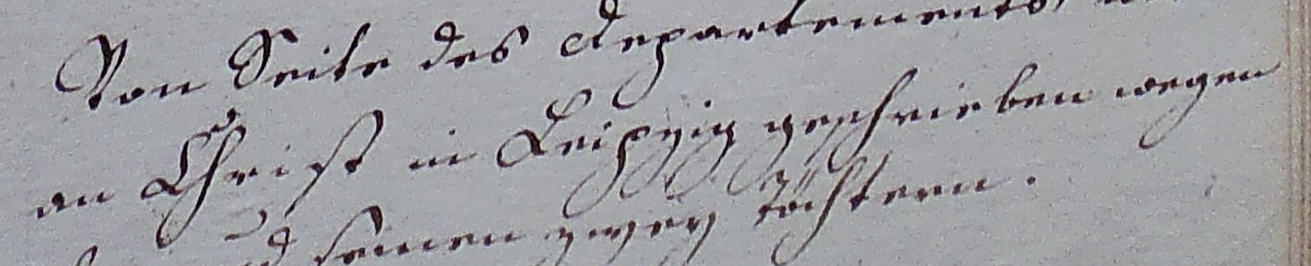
an Christ in Leipzig geschrieben wegen
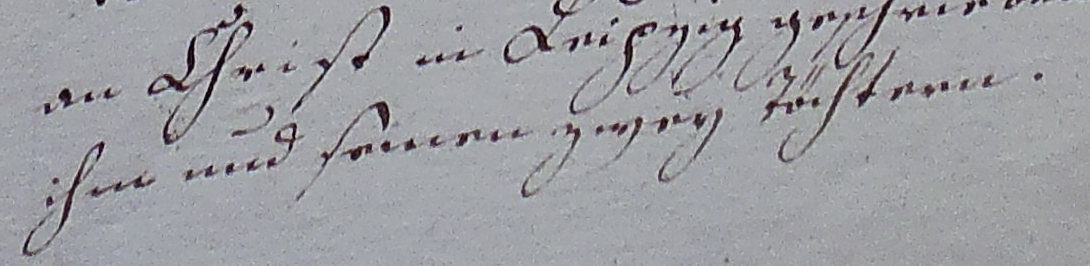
ihm und seinen zwey Töchtern.
